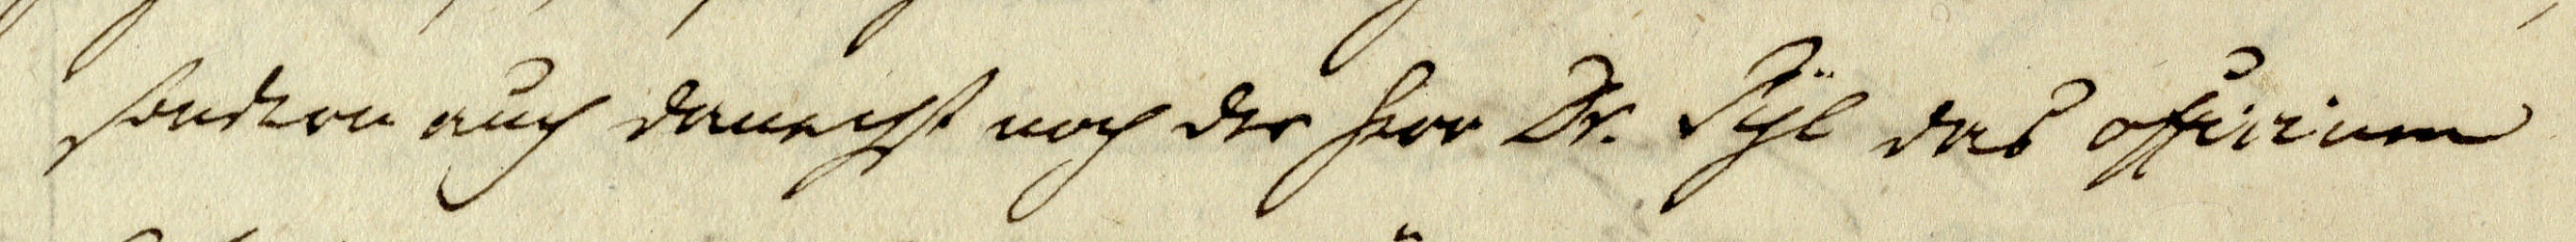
sondern auch danechst noch der Herr Dr. Pÿl das officium
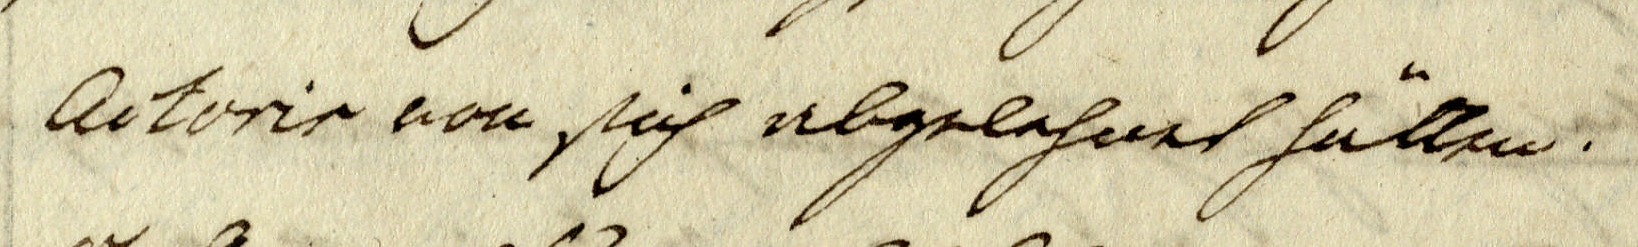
Actoris von sich abgelehnet hätten.
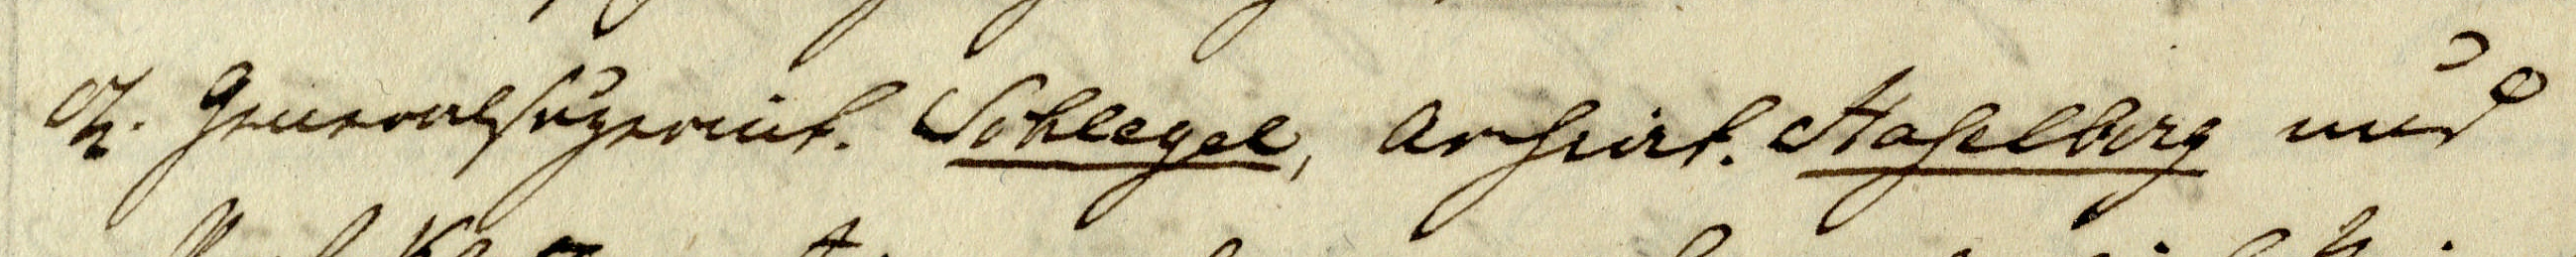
2. Generalsuperint. Schlegel, Archiat. Haselberg und
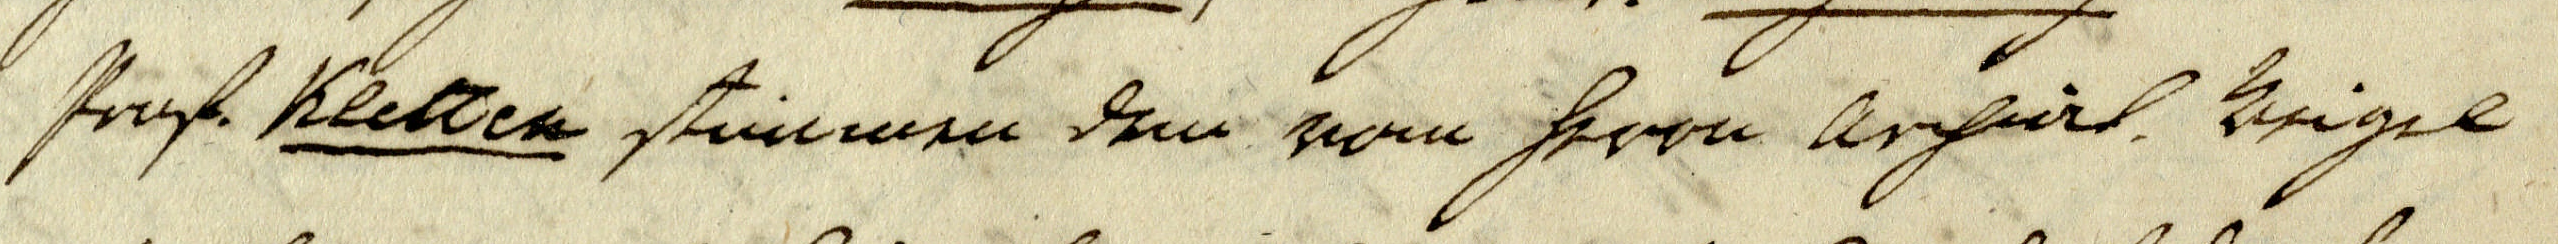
Prof. Kletten stimmen dem vom Herrn Archiat Weigel
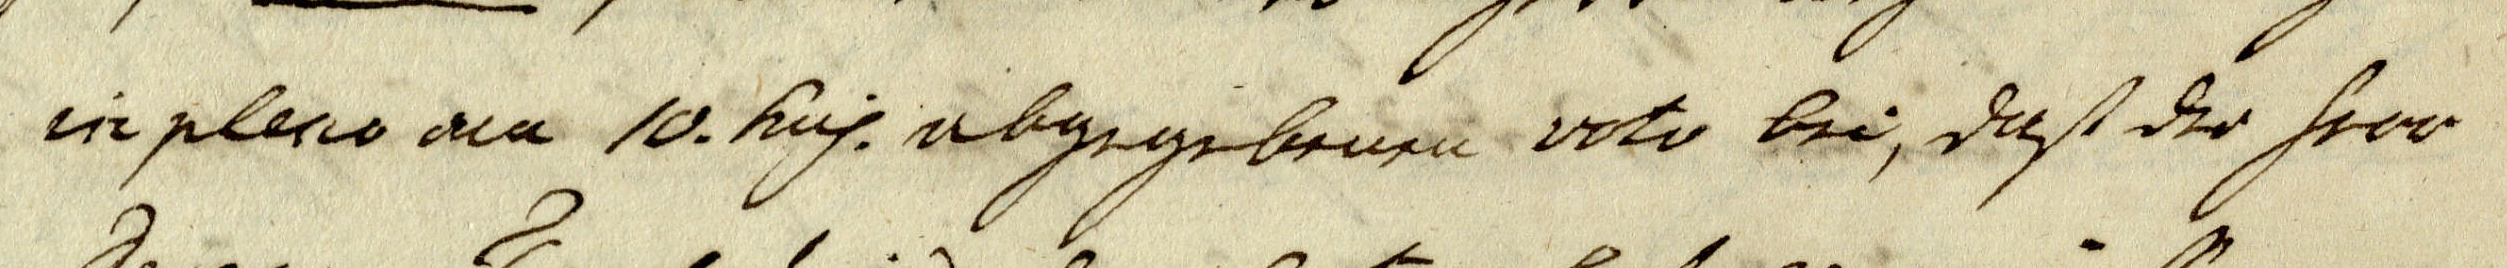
in pleno am 10. huj. abgegebenen voto bei, daß der Herr
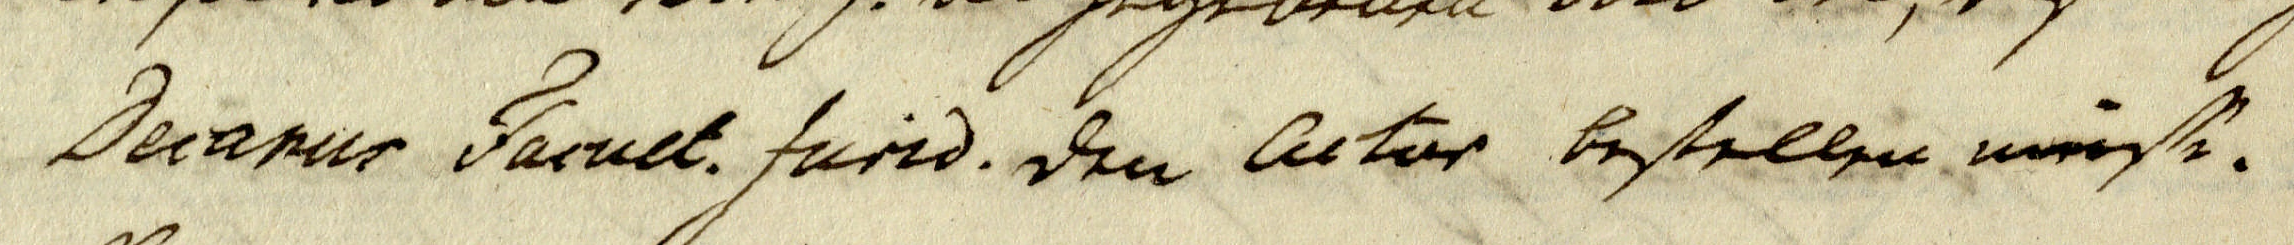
Decanus Facult. Jurid. den Actor bestellen müsse.
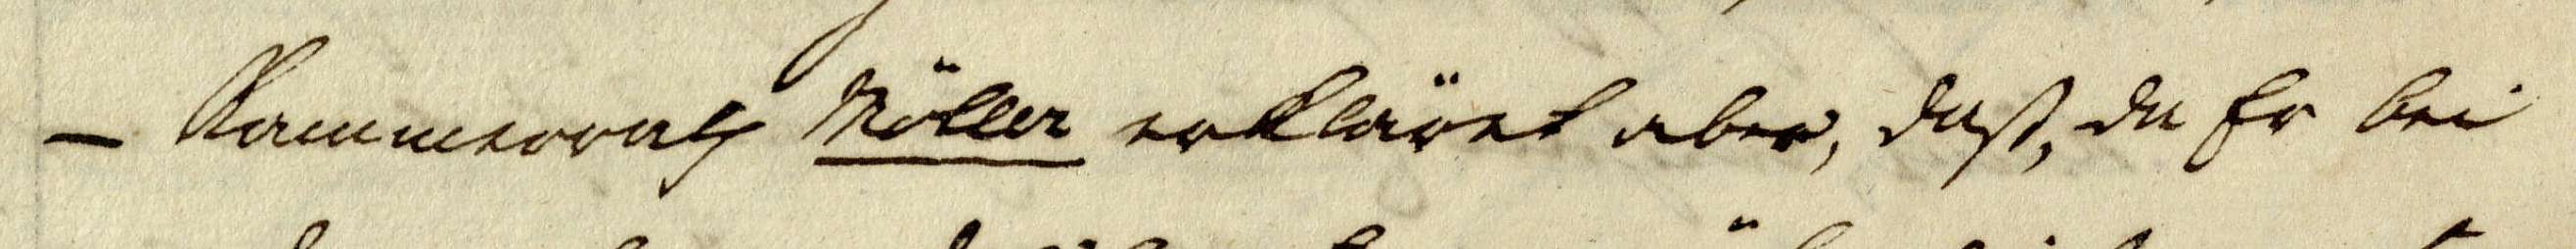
Kammerrath Möller erkläret aber, daß, da Er bei
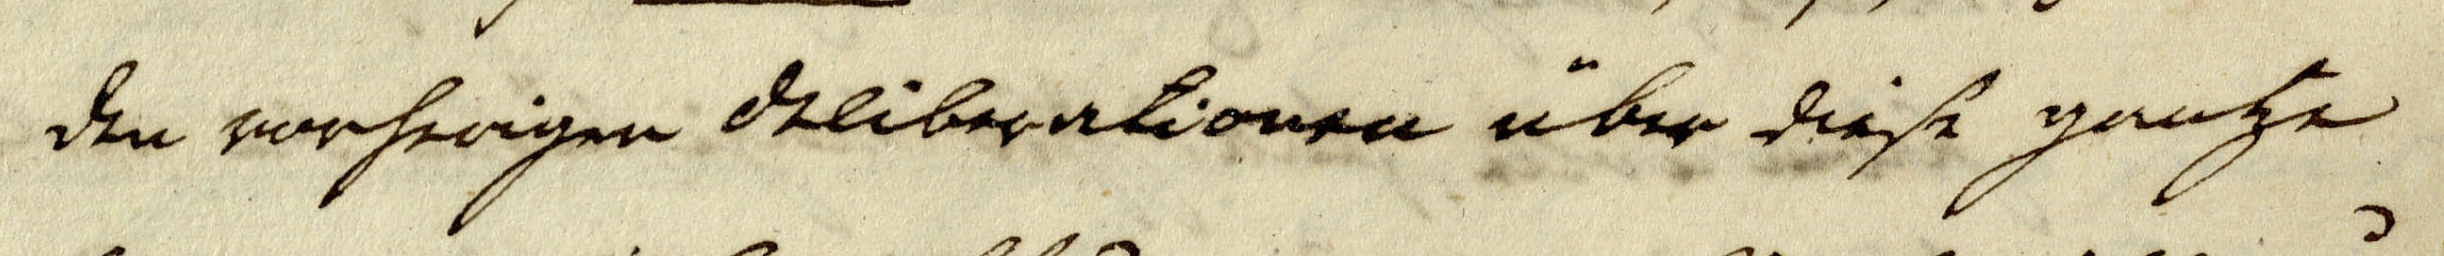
den vorherigen Deliberationen über diese gantze
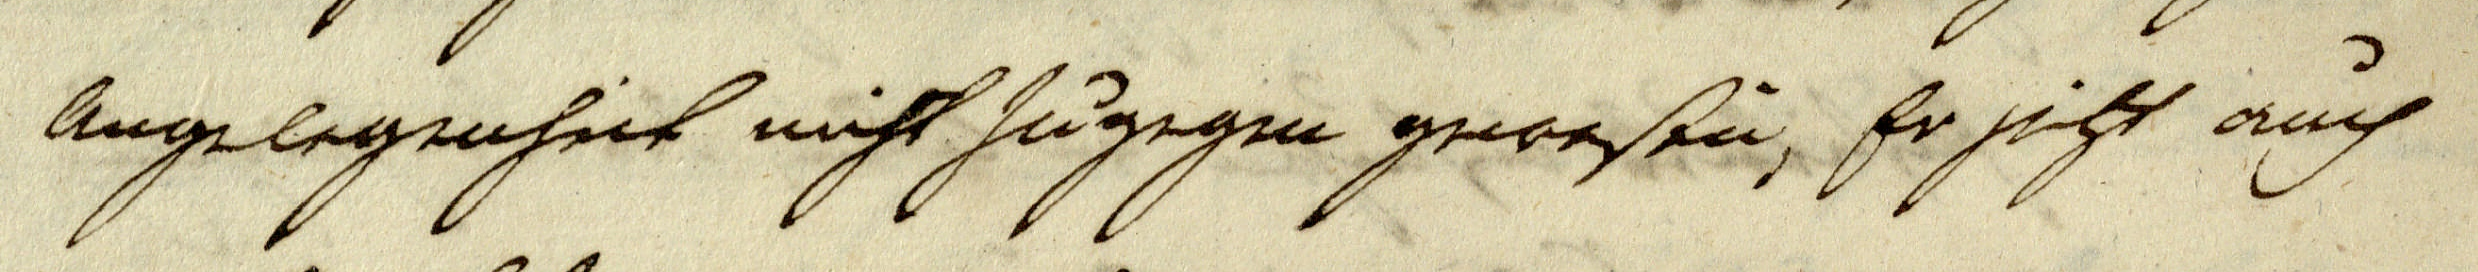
Angelegenheit nicht zugegen gewesen, Er jetzt auch
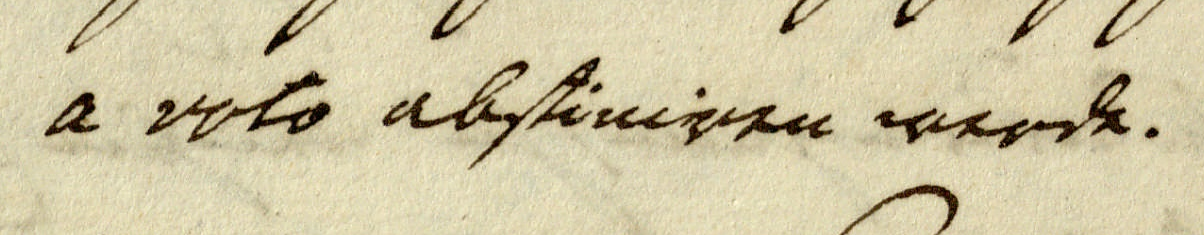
a voto abstiniren werde.
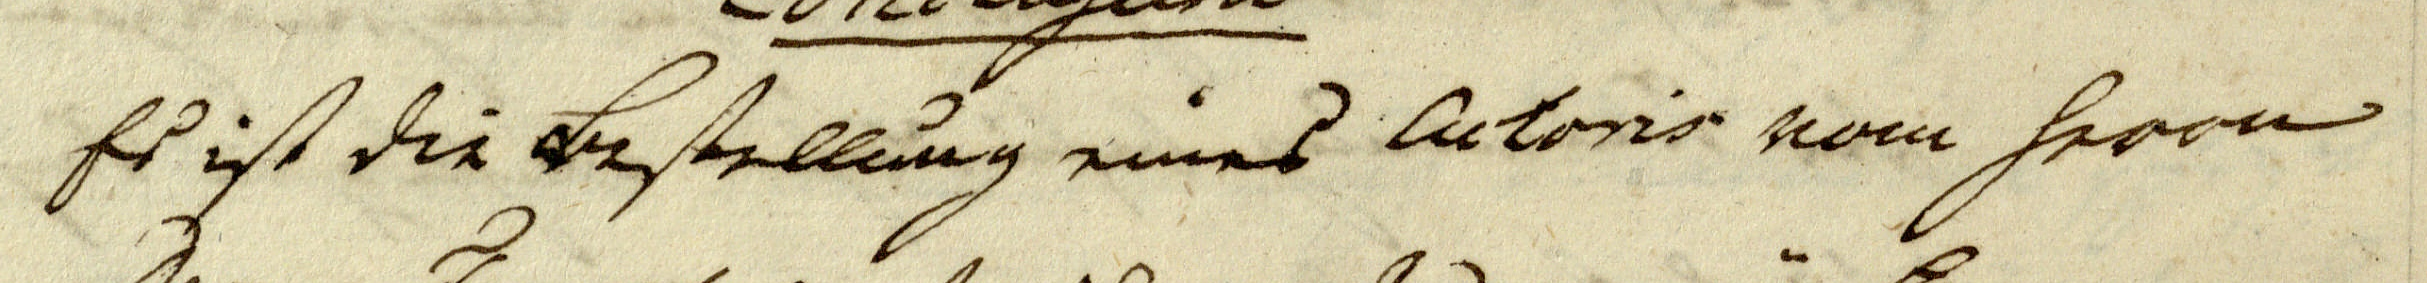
Es ist die Bestellung eines Actoris vom Herrn
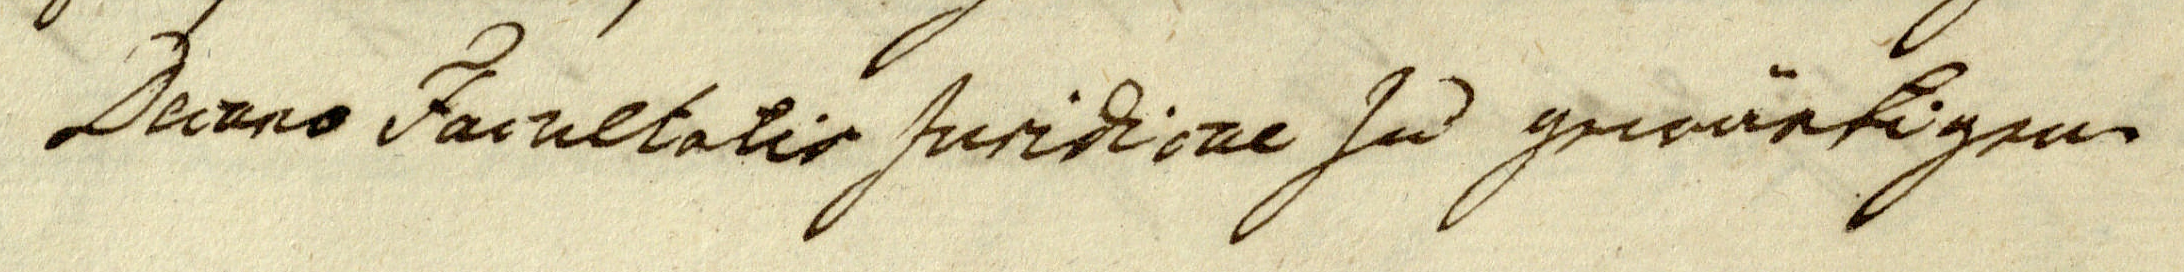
Decano Facultatis Juridicae zu gewärtigen.
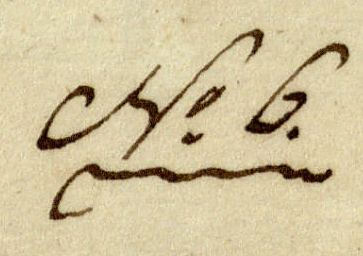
No 6.
